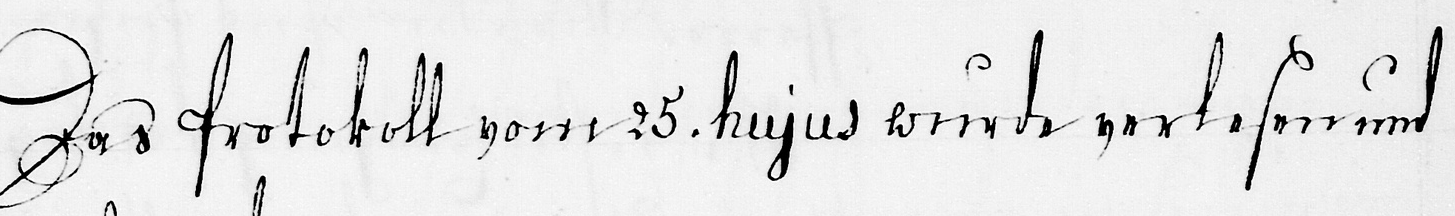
Das Protokoll vom 25. hujus wurde verlesen und
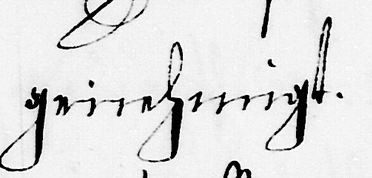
genehmigt.
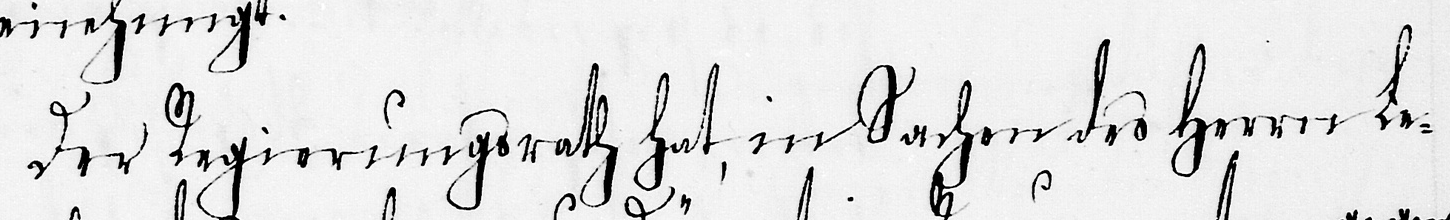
Der Regierungsrath hat, in Sachen des Herrn Le¬
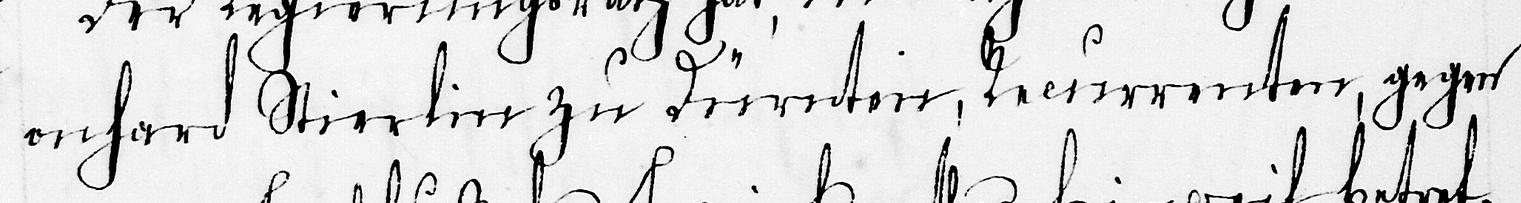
onhard Stierlin zu Dürnten, Recurrenten, gegen
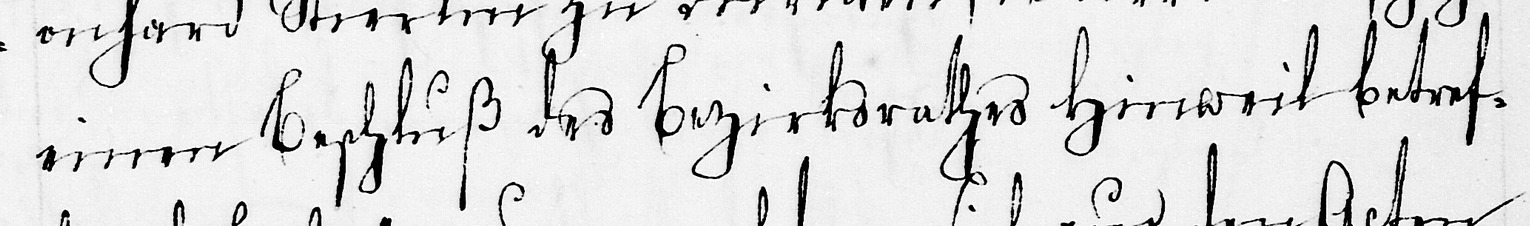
einen Beschluß des Bezirksrathes Hinweil betref¬
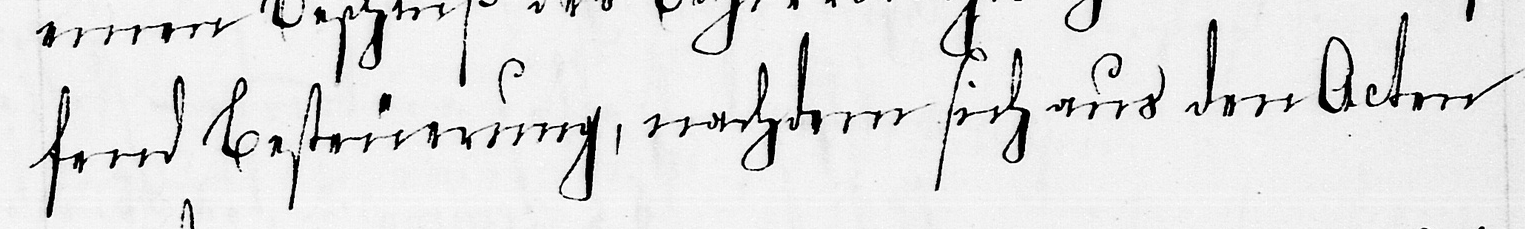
fend Besteuerung, nachdem sich aus den Acten
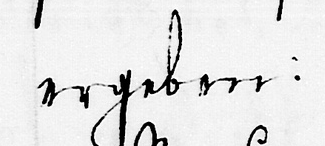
ergeben:
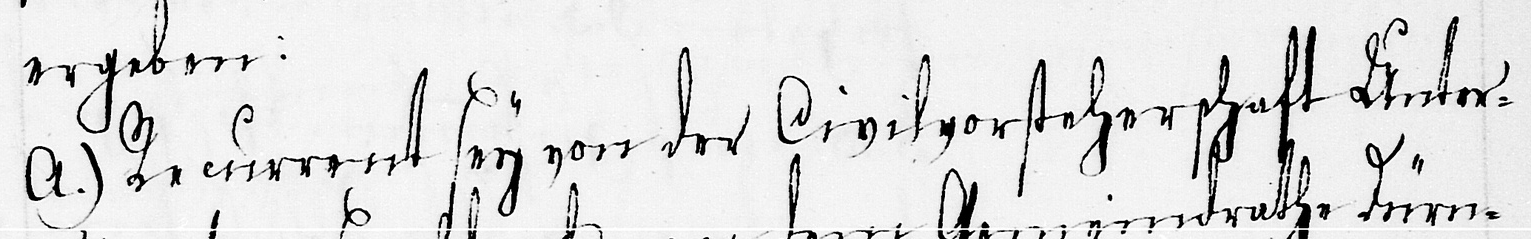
A.) Recurrent sey von der Civilvorsteherschaft Unte¬
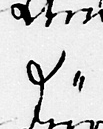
ie
